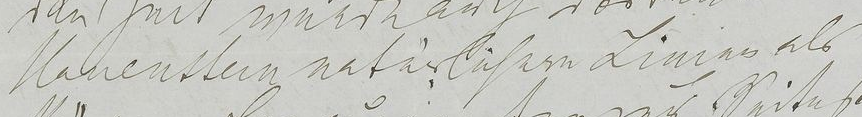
Hauenstein natürlichere Linien als
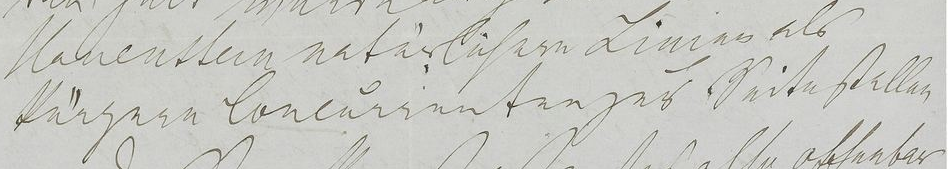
kürzere Concurrenten zur Seite stellen.
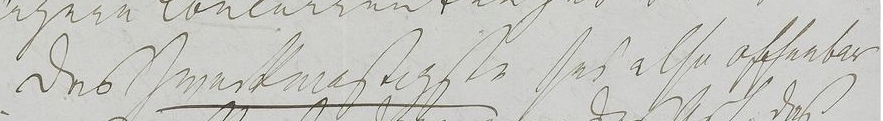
Das Zweckmäßigste sei also offenbar
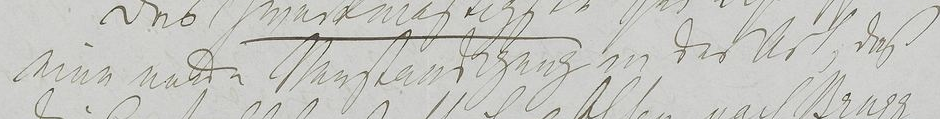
eine neue Verständigung in der Art, daß
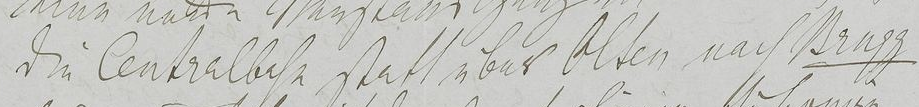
die Centralbahn statt über Olten nach Brugg
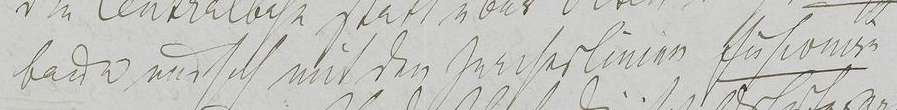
baue und sich mit den Zürcherlinien fusionire
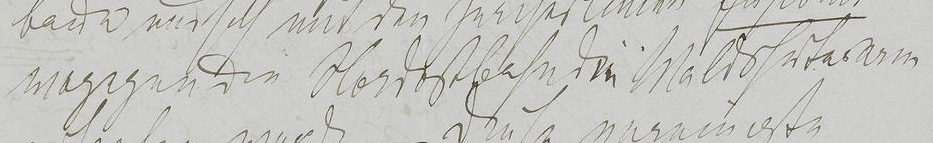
wogegen die Nordostbahn den Waldshuterarm
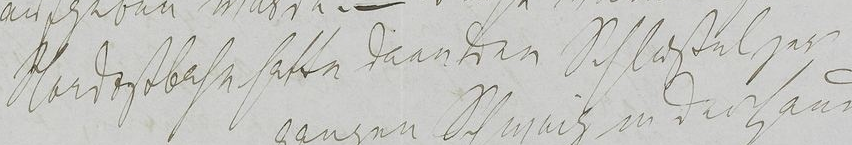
Nordostbahn hätte dann den Schlüßel zur
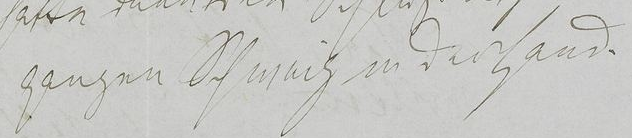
ganzen Schweiz in der Hand.
